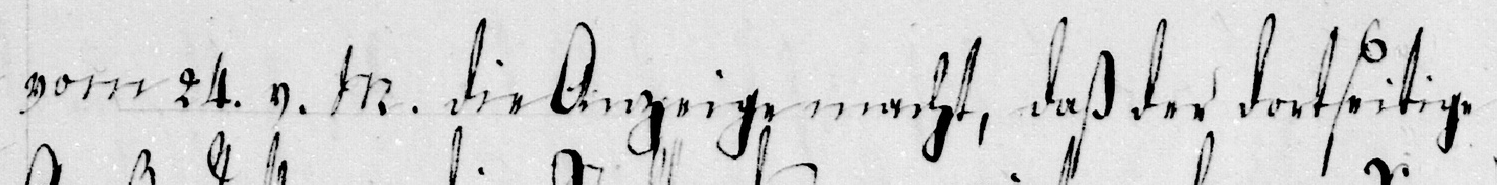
vom 24. v. M. die Anzeige macht, daß der dortseitige
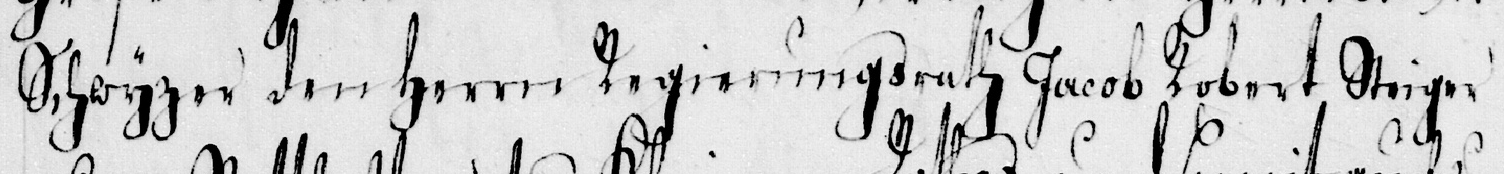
Schwyzer den Herrn Regierungsrath Jacob Robert Steiger
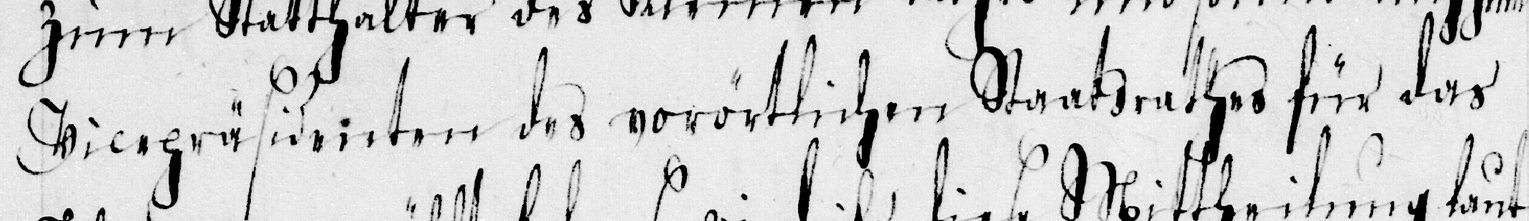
Vicepräsidenten des vorörtlichen Staatsrathes für das
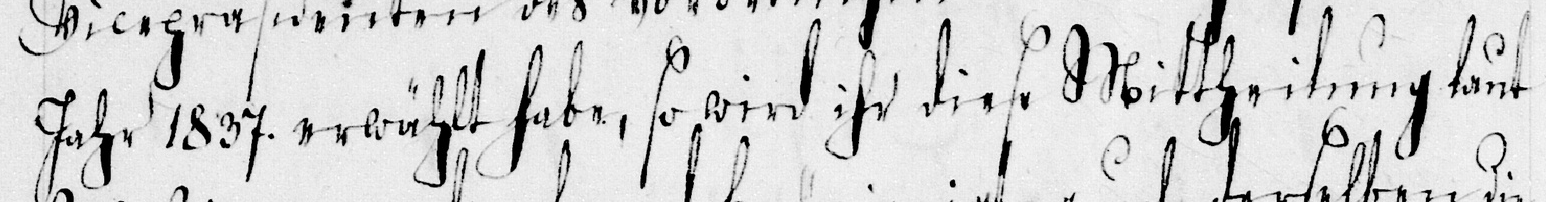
Jahr 1837. erwählt habe, so wird ihr diese Mittheilung laut
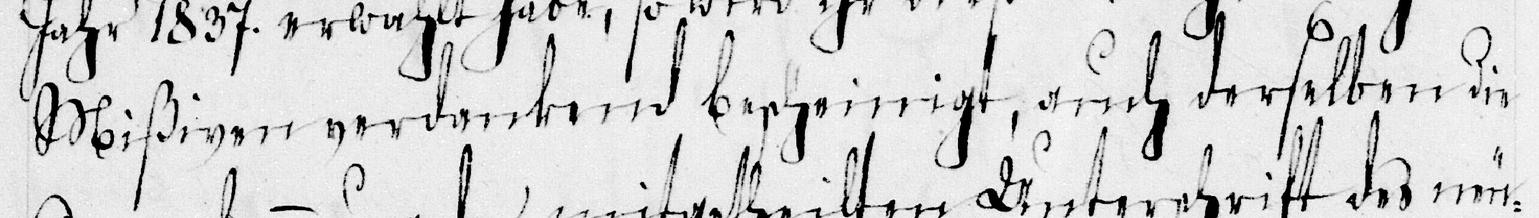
Mißiven verdankend bescheinigt, auch derselben die
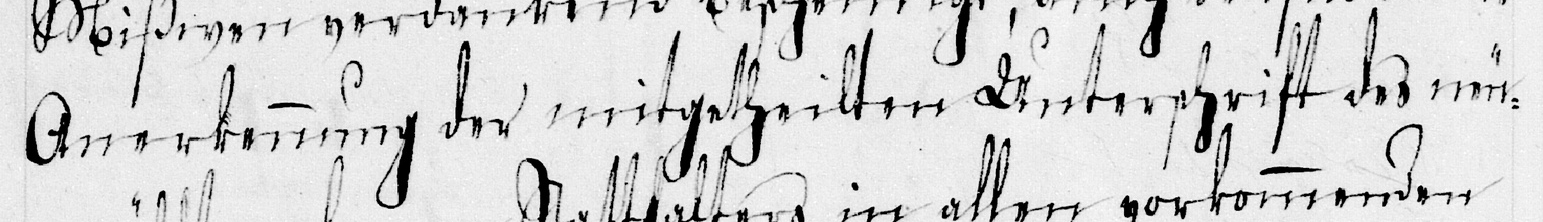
Anerkennung der mitgetheilten Unterschrift des neu¬
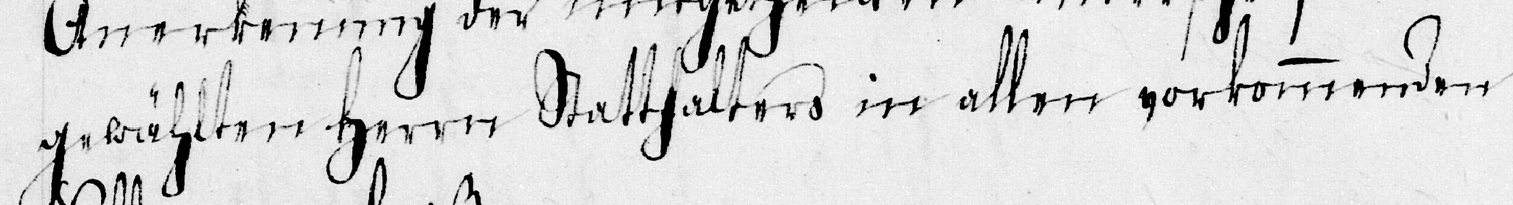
gewählten Herrn Statthalters in allen vorkommenden
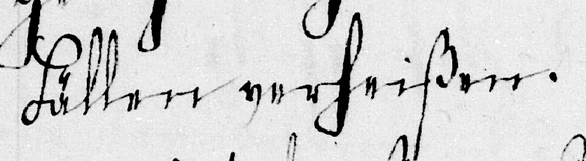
Fällen verheißen.
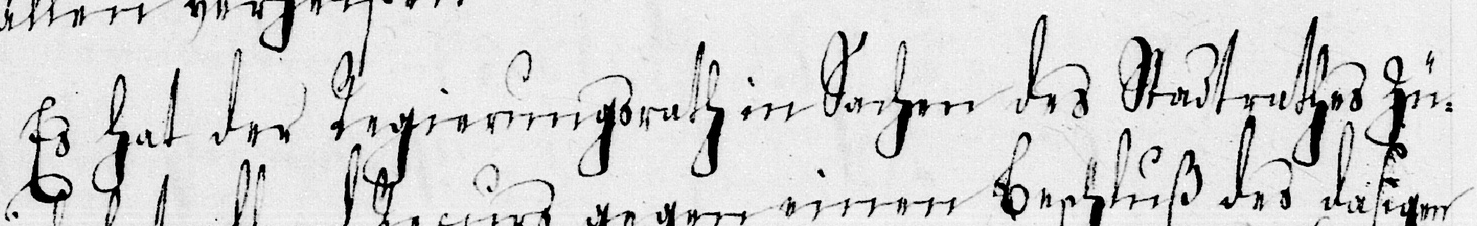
Es hat der Regierungsrath in Sachen des Stadtrathes Zü¬
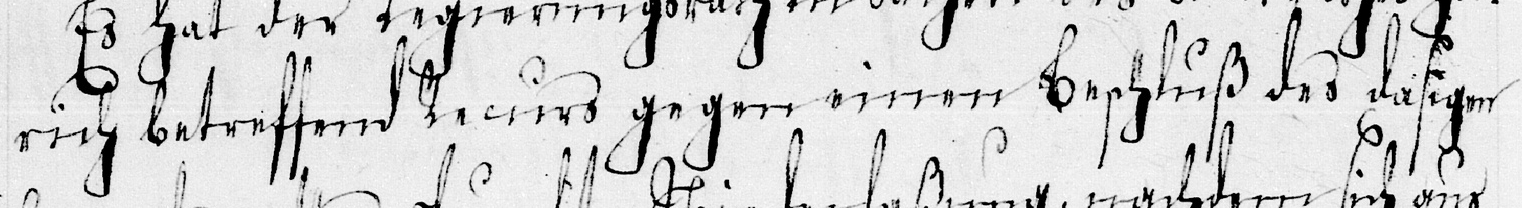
rich betreffend Recurs gegen einen Beschluß des dasigen
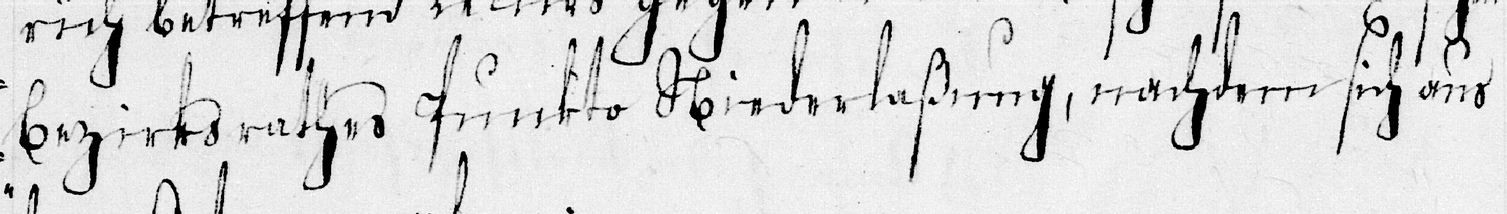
Bezirksrathes Punkto Niederlaßung, nachdem sich aus
